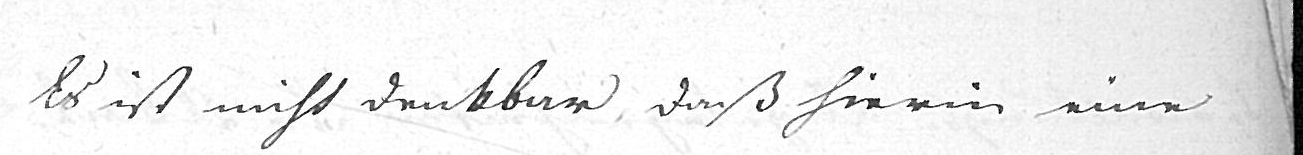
Es ist nicht denkbar, daß hierin eine
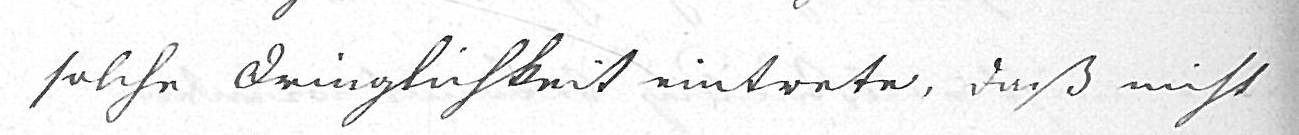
solche Dringlichkeit eintrete, daß nicht
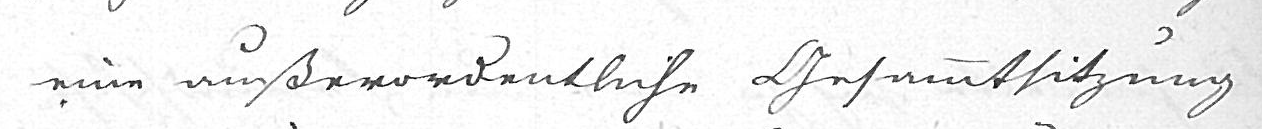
eine außerordentliche Gesammtsitzung
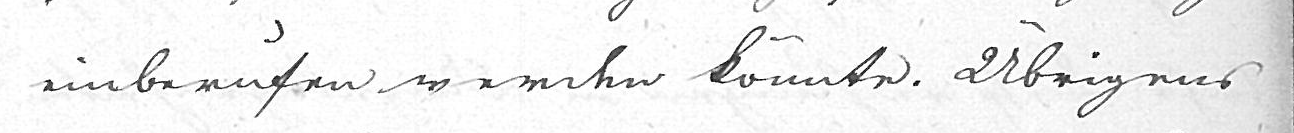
einberufen werden könnte. Übrigens
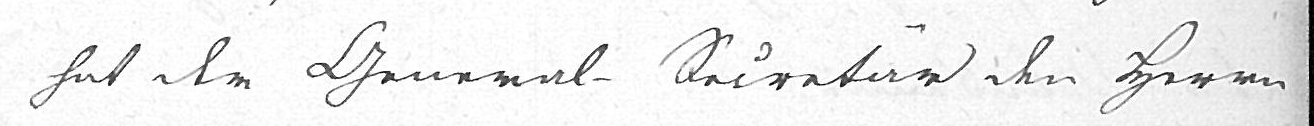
hat der General-Secretär den Herrn
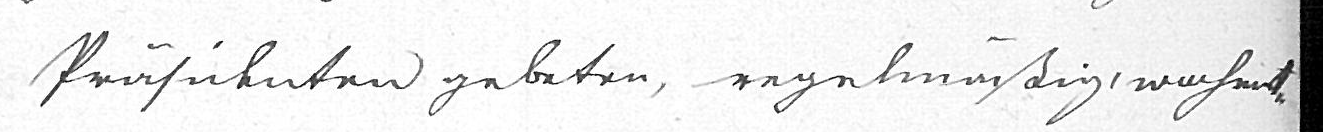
Präsidenten gebeten, regelmäßig wöchent-
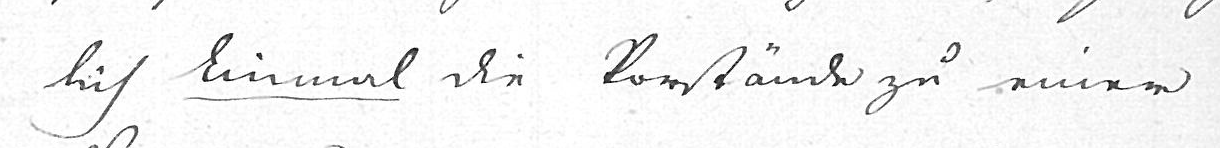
lich Einmal die Vorstände zu einer
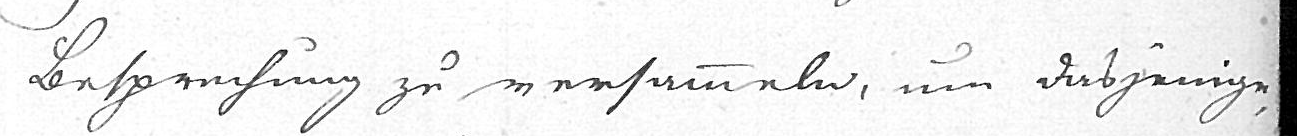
Besprechung zu versammeln, um dasjenige,
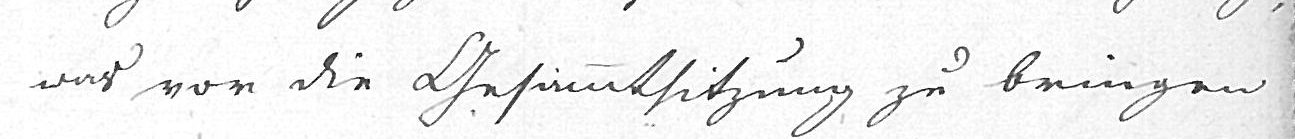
was vor der Gesammtsitzung zu bringen
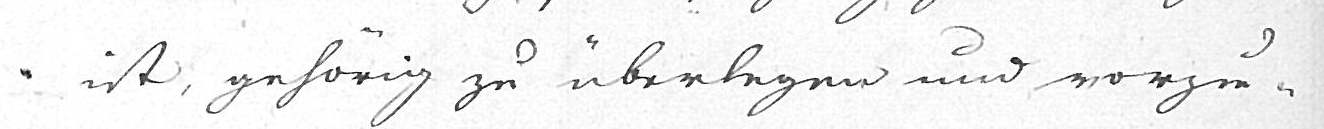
ist, gehörig zu überlegen und vorzu
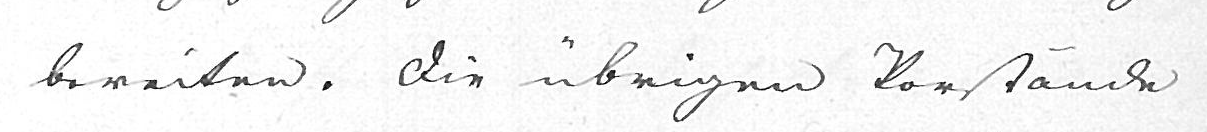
bereiten. Die übrigen Vorstände
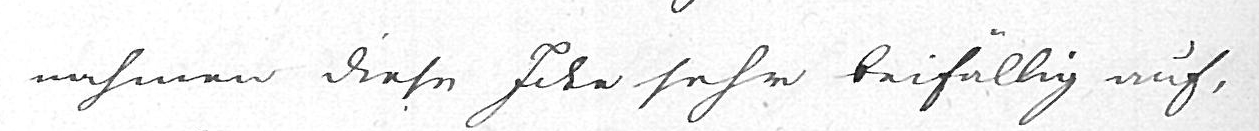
nahmen diese Idee sehr beifällig auf,
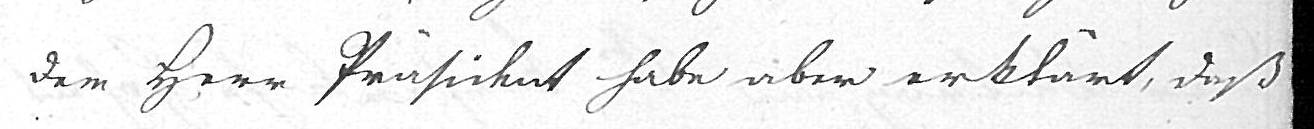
Der Herr Präsident habe aber erklärt, daß
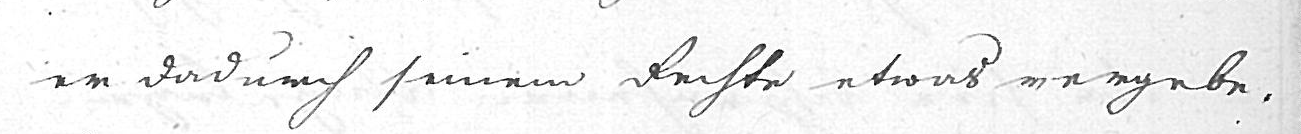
er dadurch seinem Rechte etwas vergebe.
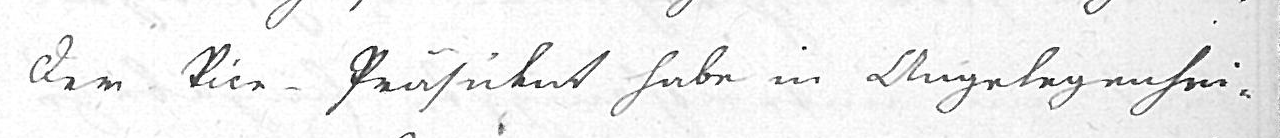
Der Vice-Präsident habe in Angelegenhei-
